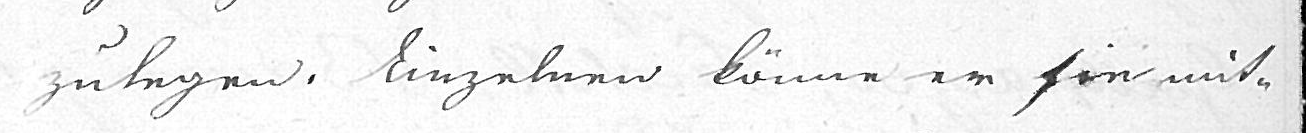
zulegen. Einzelnen könne er sie mit-
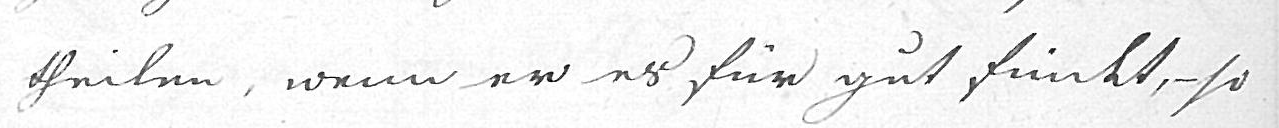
theilen, wenn er es für gut findet, so
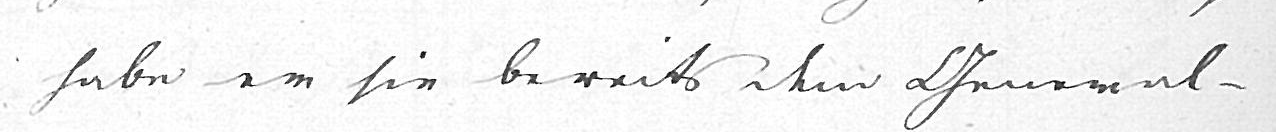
habe er sie bereits dem General-
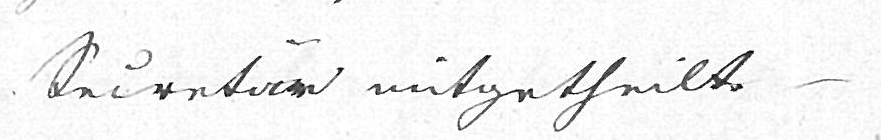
Secretär mitgetheilt.
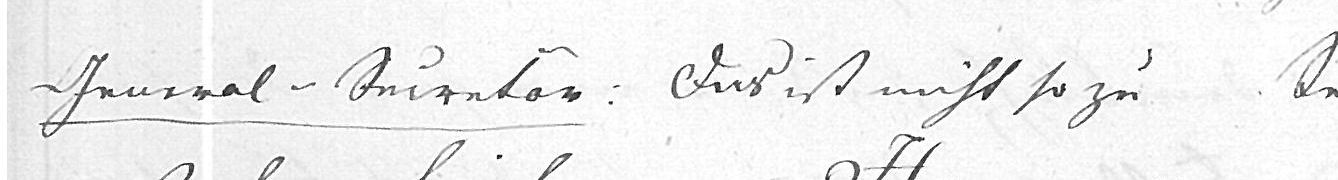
General-Secretär: Das ist nicht so zu
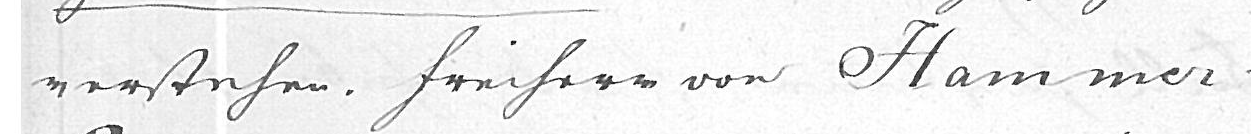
verstehen. Freiherr von Hammer-
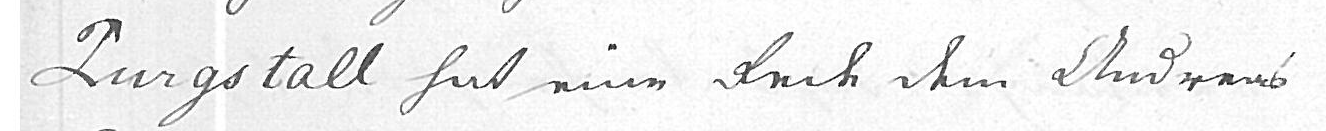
Purgstall hat eine Rede dem Andreas
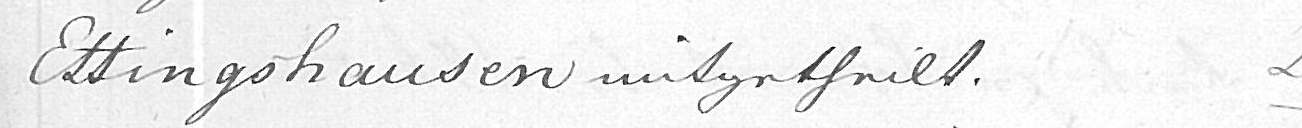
Ettingshausen mitgetheilt.
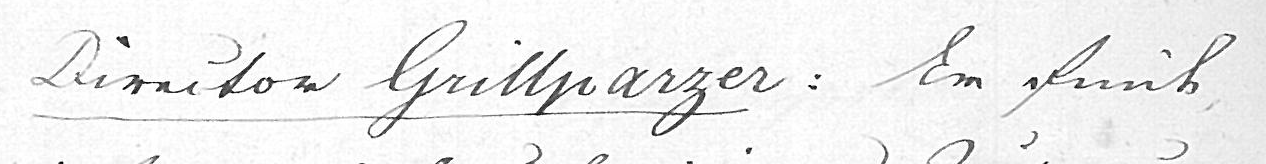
Director Grillparzer: Er finde,
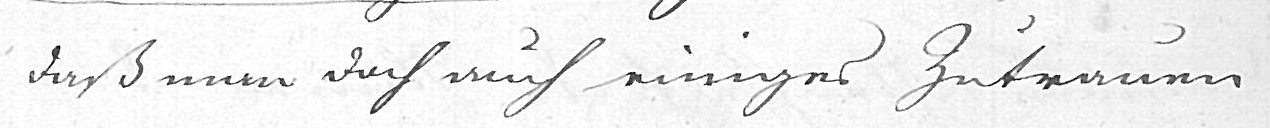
daß man doch auch einiges Zutrauen
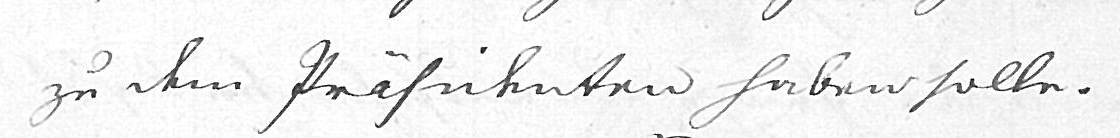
zu dem Präsidenten haben solle.
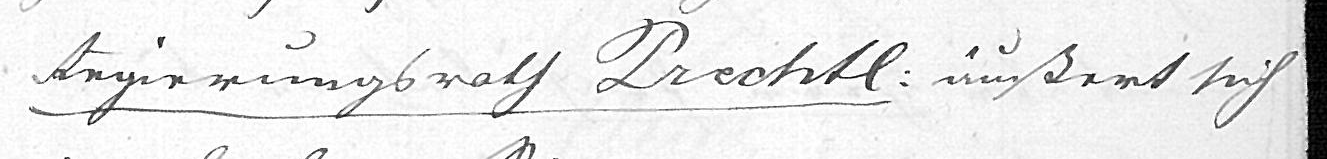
Regierungsrath Prechtl: äußert sich
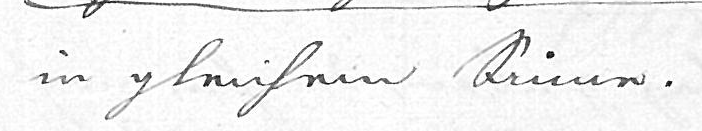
in gleichem Sinne.
